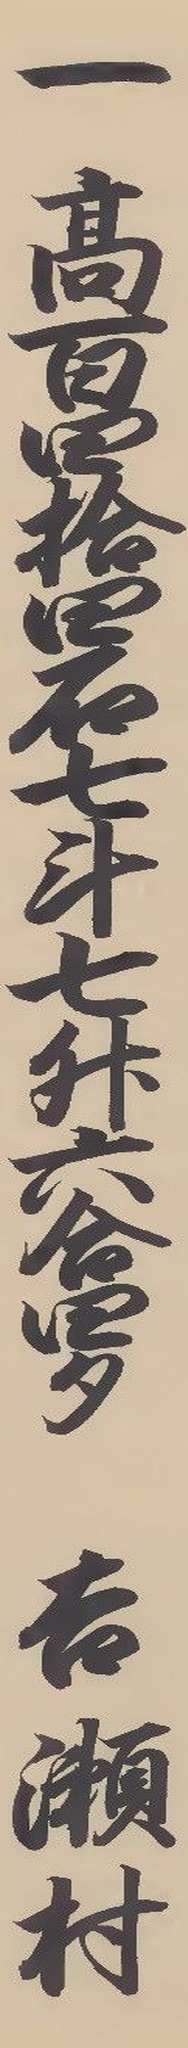一高百四拾四石七斗七升六合四勺吉瀬村
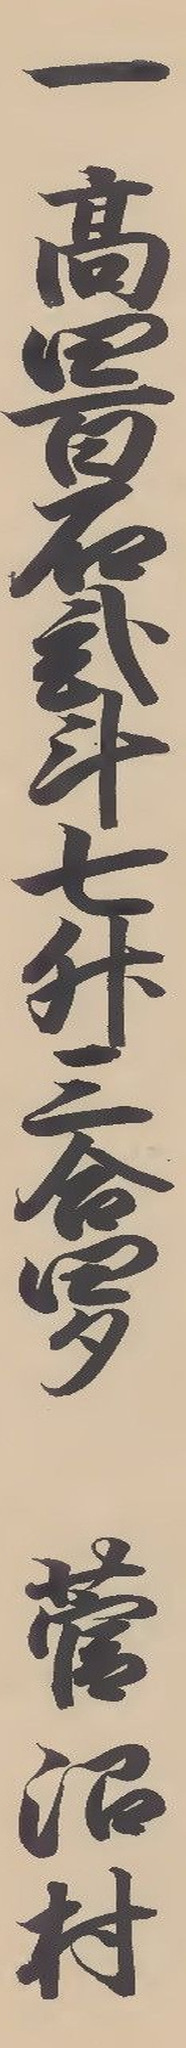一高四百石弐斗七升三合四勺菅沼村
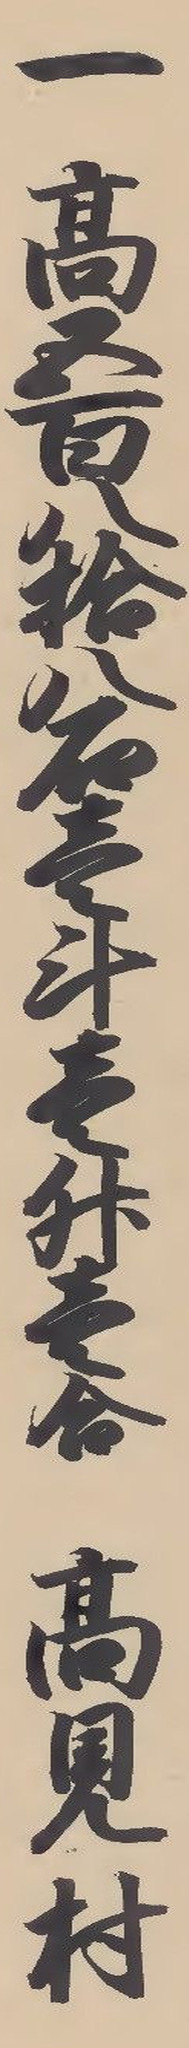一高五百八拾八石壱斗壱升壱合高見村
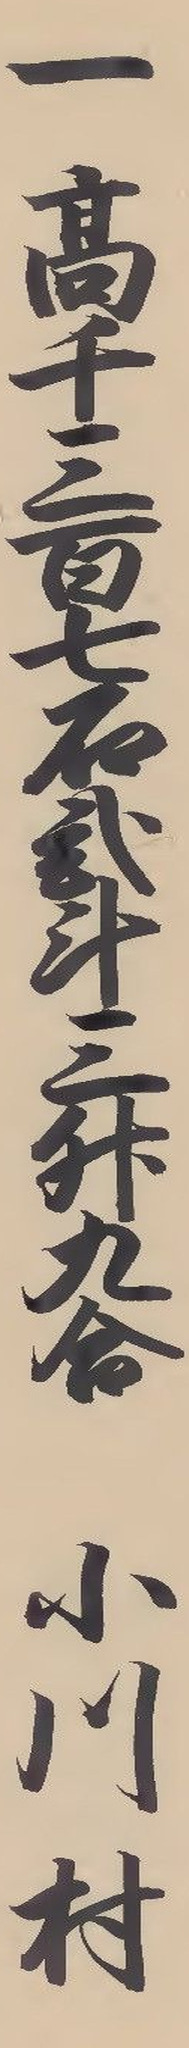一高千三百七石弐斗三升九合小川村
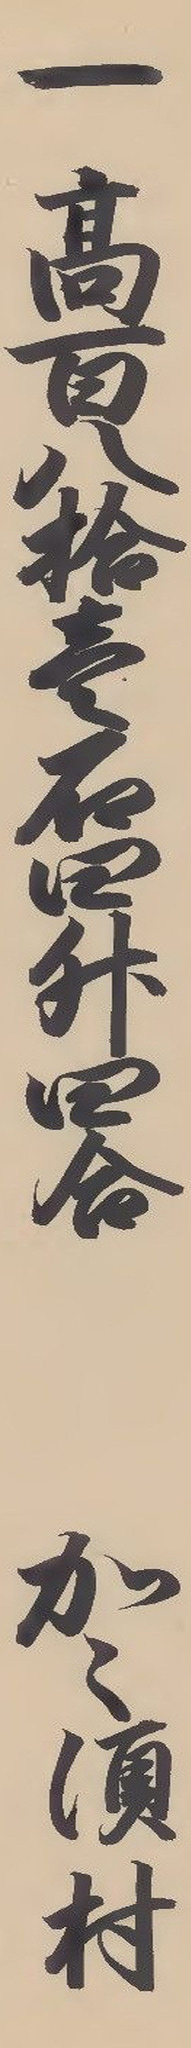一高百八拾壱石四升四合加々須村
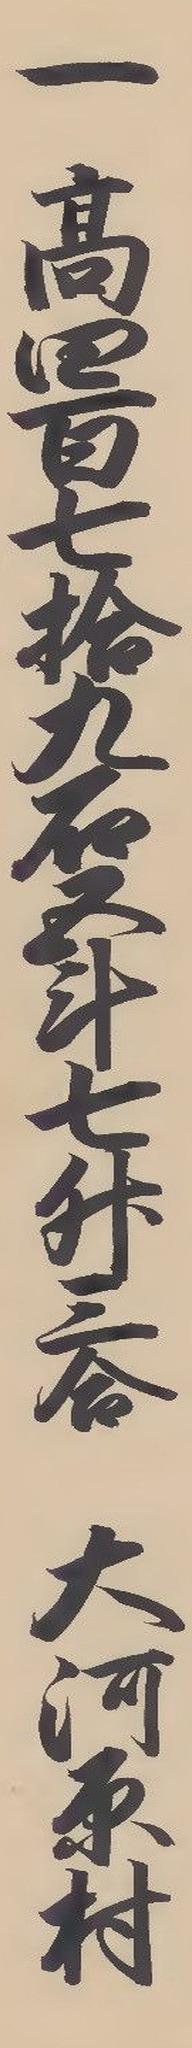一高四百七拾九石五斗七升三合大河原村

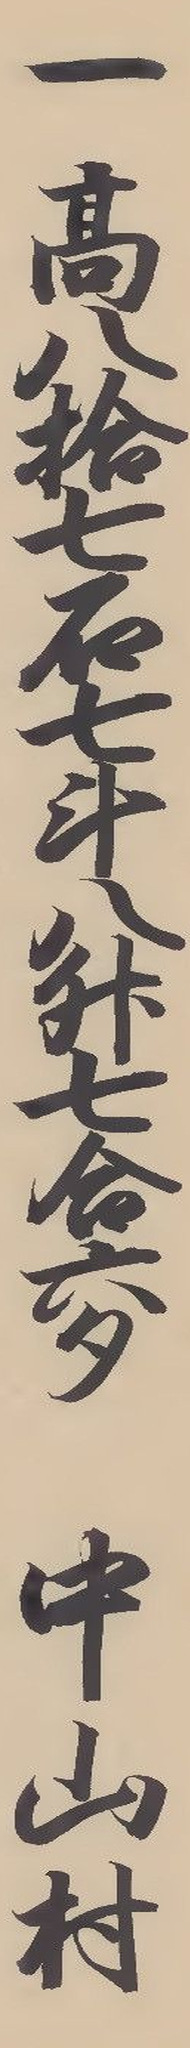一高八拾七石七斗八升七合六勺中山村
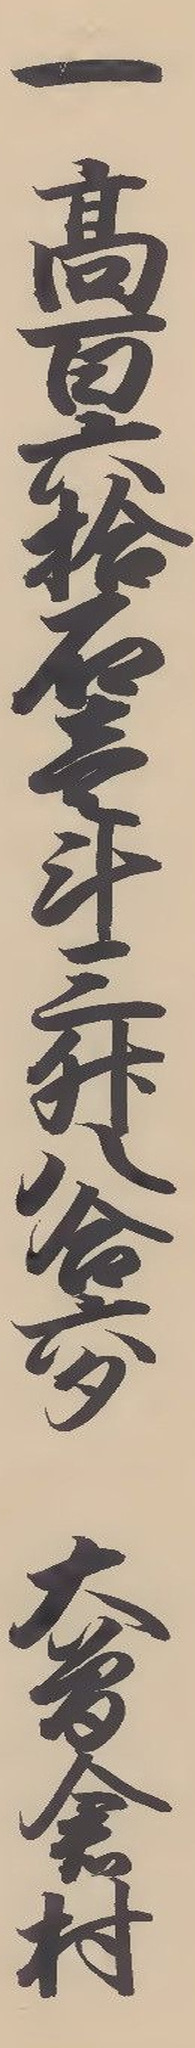一高百六拾石壱斗三升八合六勺大曽倉村
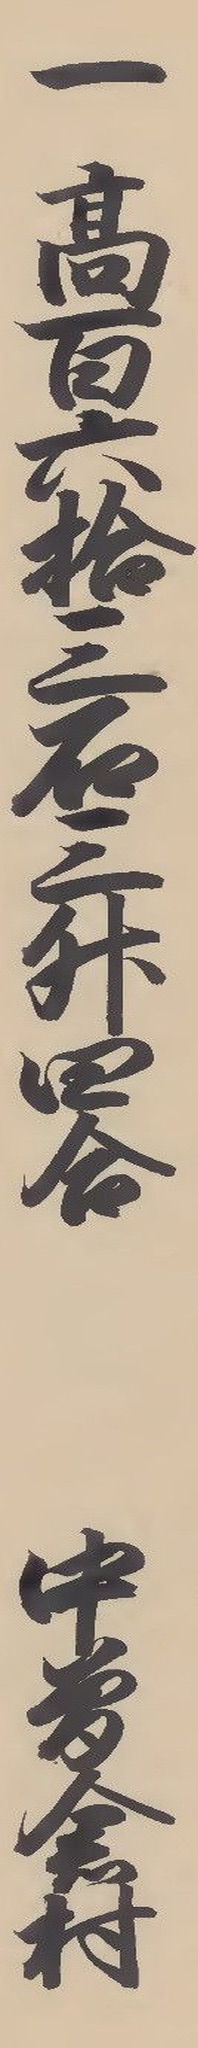一高百六拾三石三升四合中曽倉村
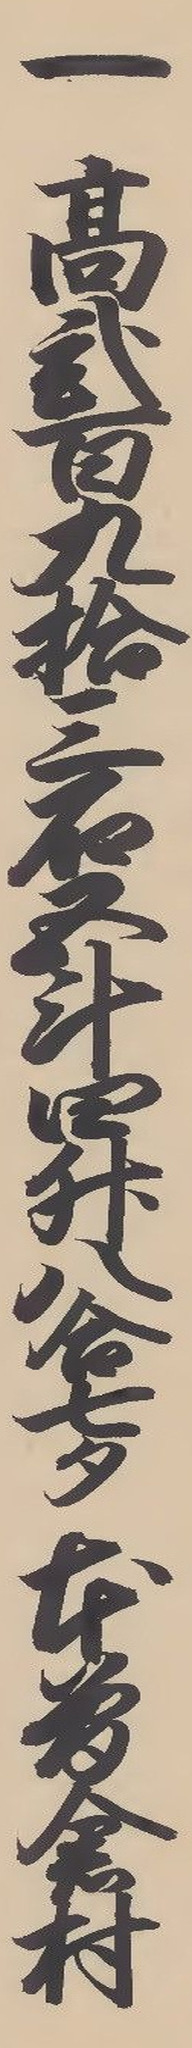一高弐百九拾三石五斗四升八合七勺本曽倉村
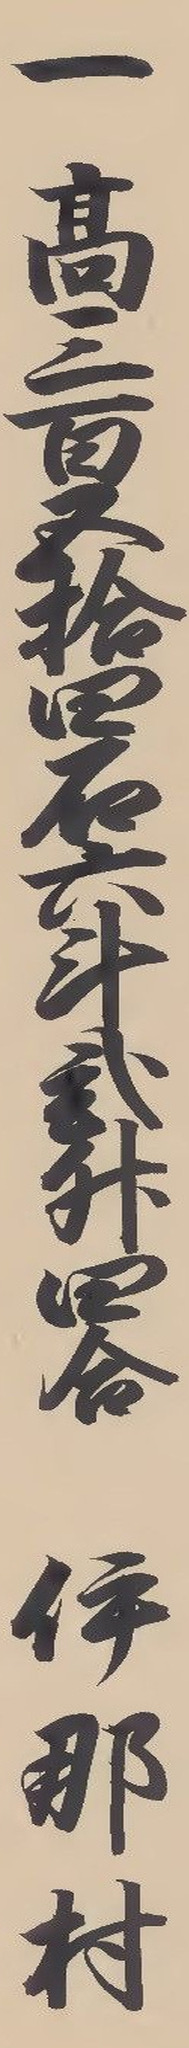一高三百五拾四石六斗弐升四合伊那村
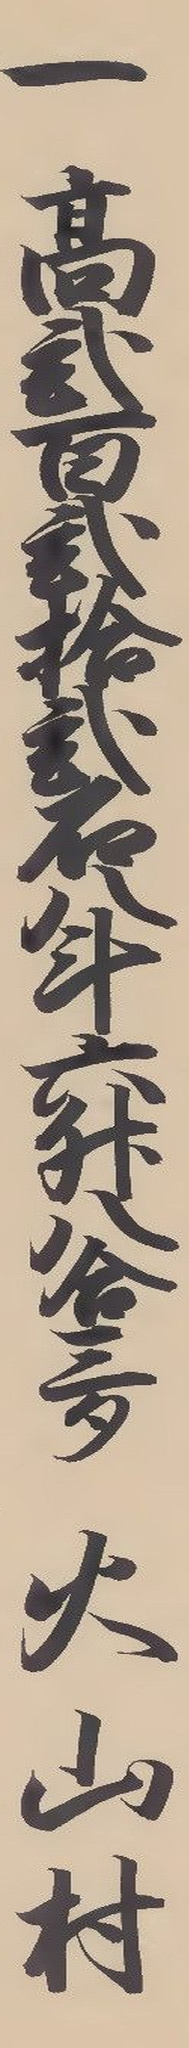一高弐百弐拾弐石八斗六升八合三勺火山村
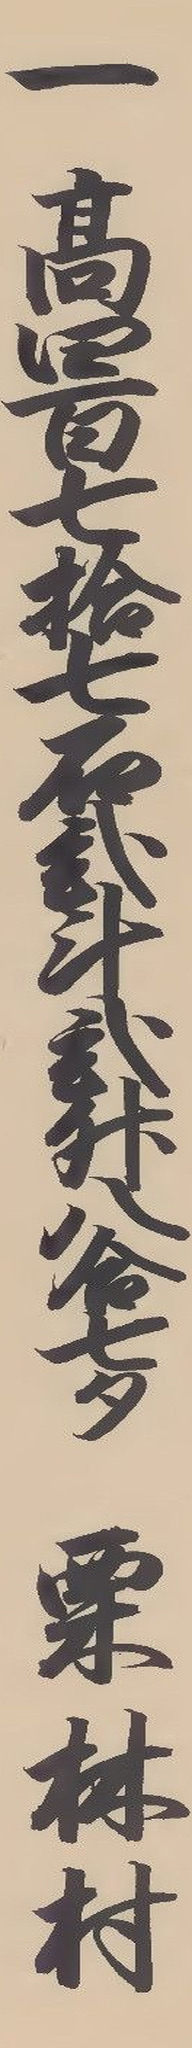一高四百七拾七石弐斗弐升八合七勺栗林村
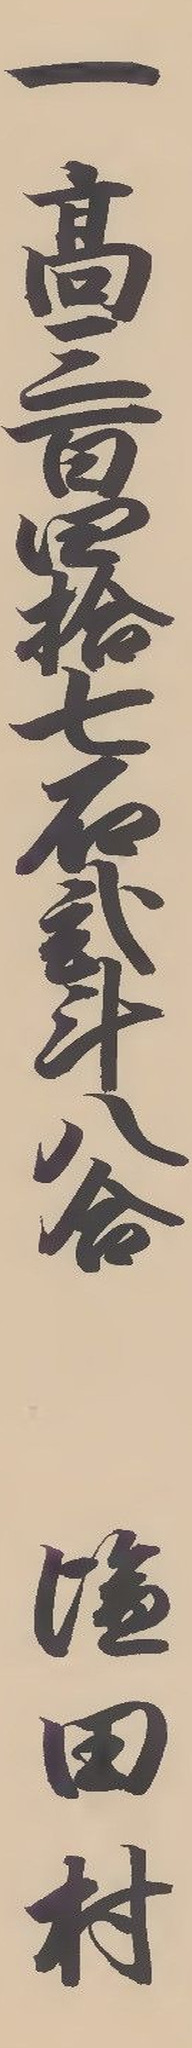一高三百四拾七石弐斗八合塩田村

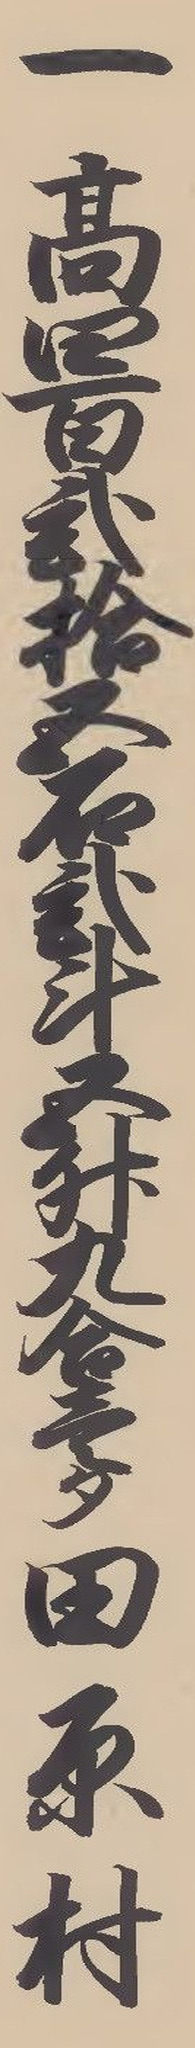一高四百弐拾五石弐斗五升九合壱勺田原村
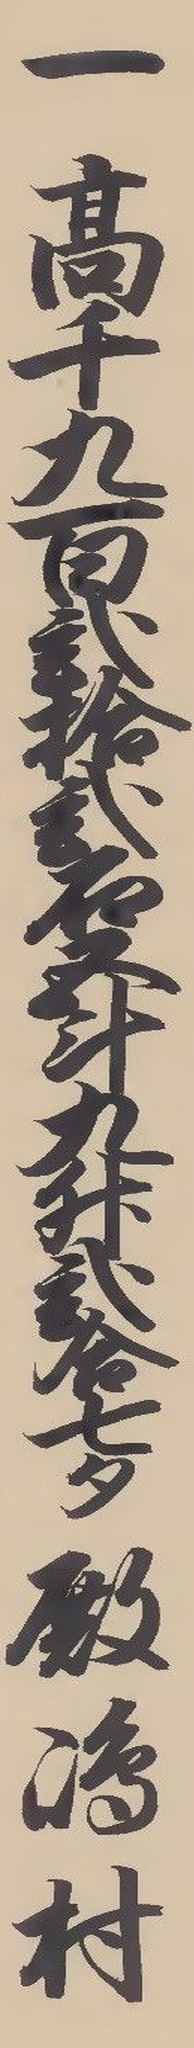一高千九百弐拾弐石五斗九升弐合七勺殿島村
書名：信濃国郷帳
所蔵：国立公文書館 National Archives of Japan
